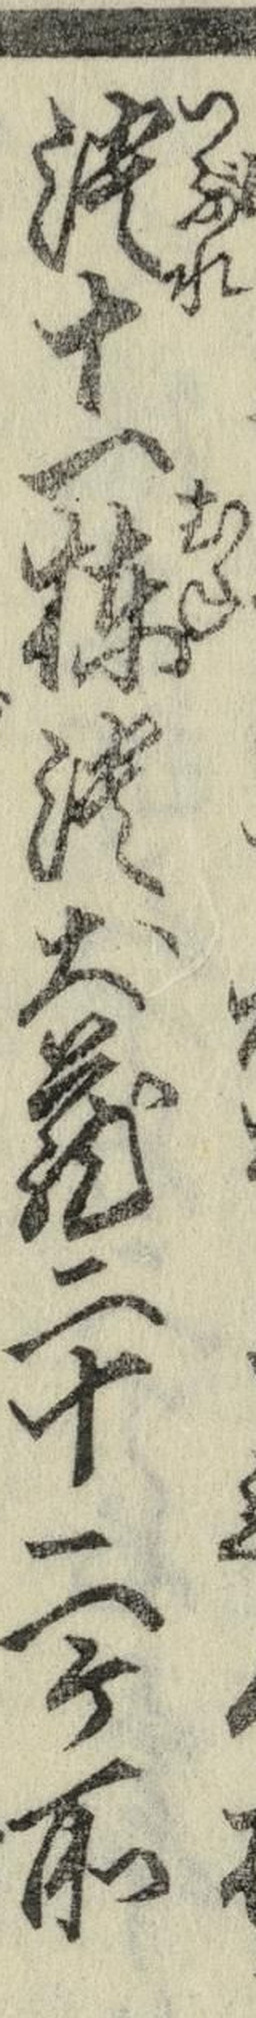潰十棟潰土蔵二十二ケ所
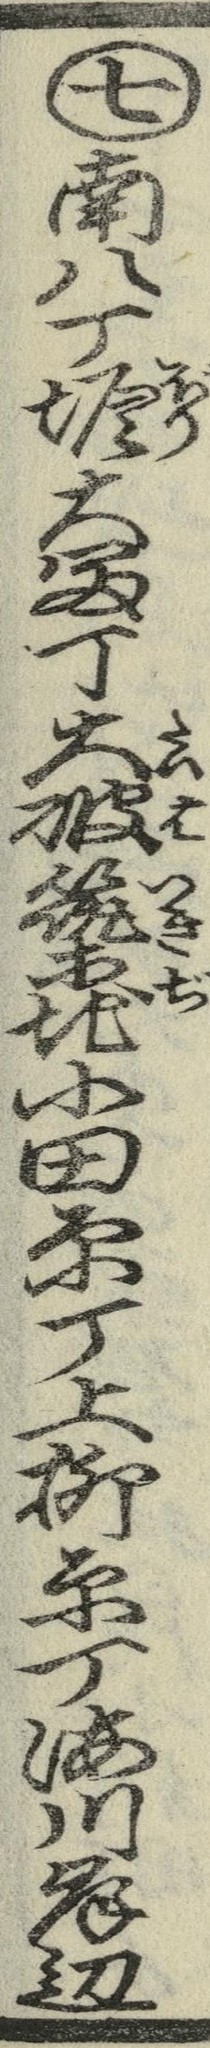㊆南八丁堀大富丁大破築地小田原丁上柳原丁海川岸辺
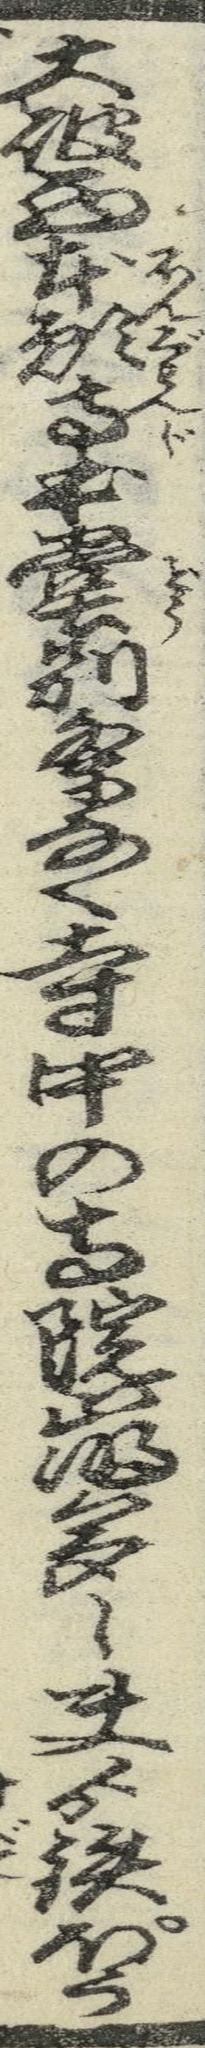大破西本願寺本堂別条なく寺中の寺院崩多し夫ゟ鉄ぽう
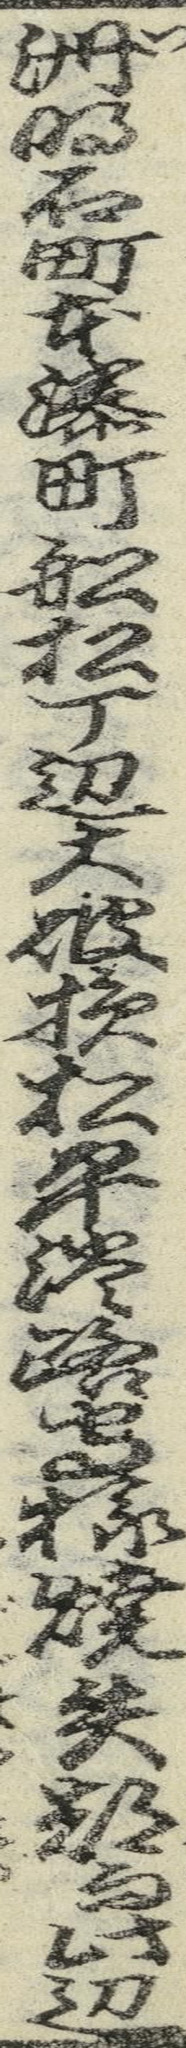洲明石町本湊町舩松丁辺大破損松平淡路守様焼失都而此辺
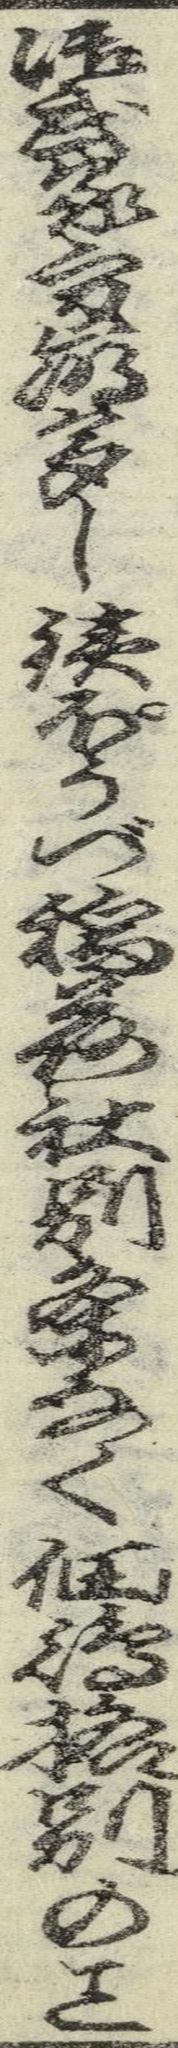御武家方崩多し鉄ぽうづ稲荷社別条なく佃嶋格別のこと
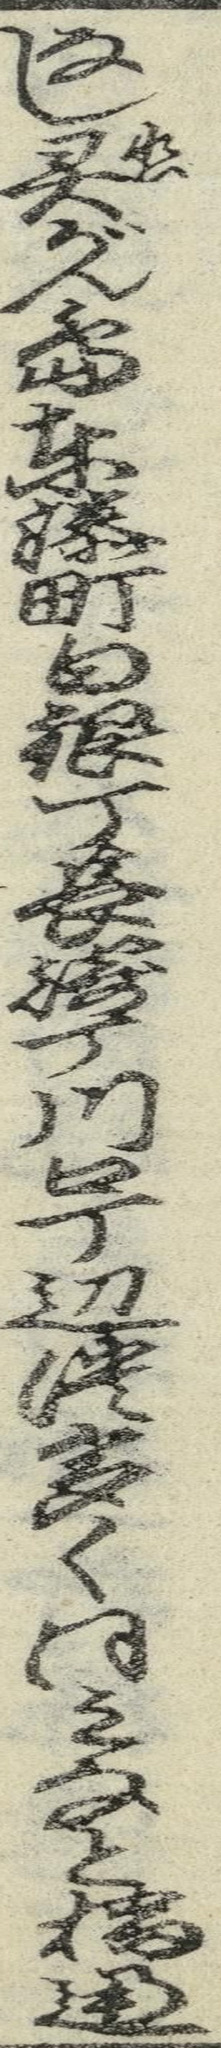なし霊がん島東湊町白銀丁長崎丁川口丁辺潰多く同みなと橋通
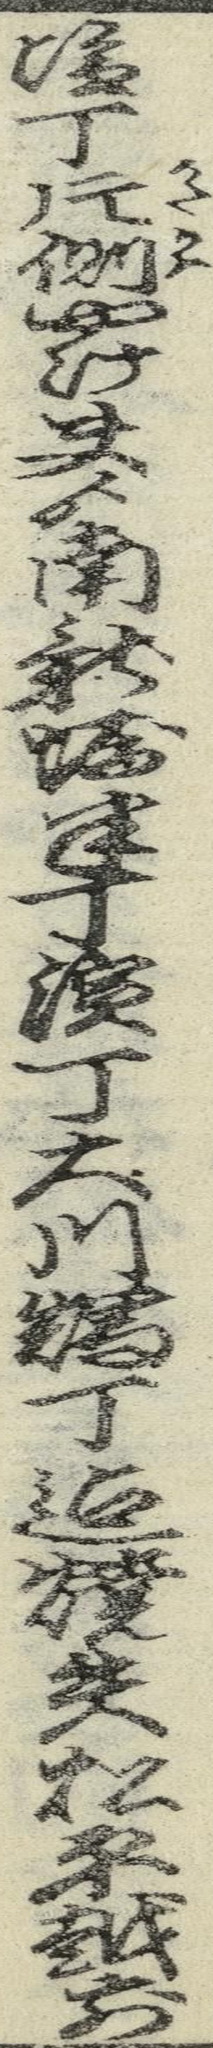塩丁片側やけ夫ゟ南新堀半丁浜丁大川端丁迠焼失松平越前
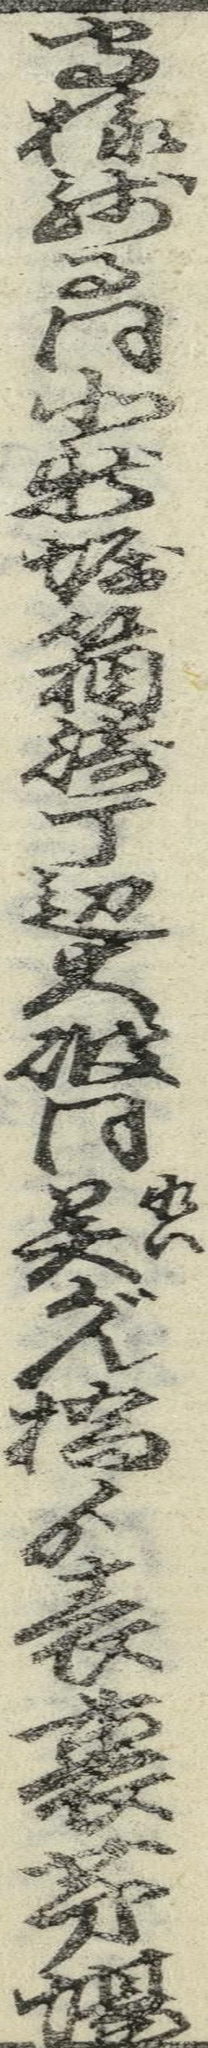守様残る同北新堀箱崎丁辺大破同霊がん橋ゟ表裏茅場
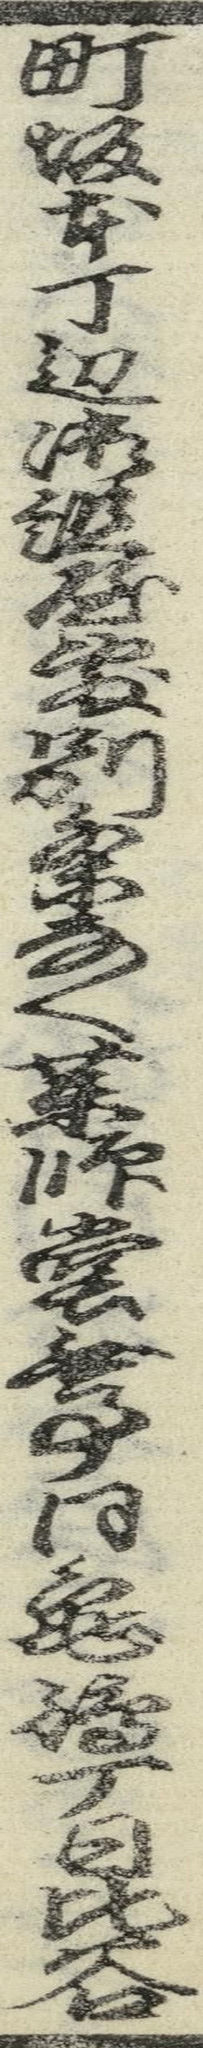町坂本丁辺御組屋敷別条なく薬師堂無事同亀嶋丁日比谷
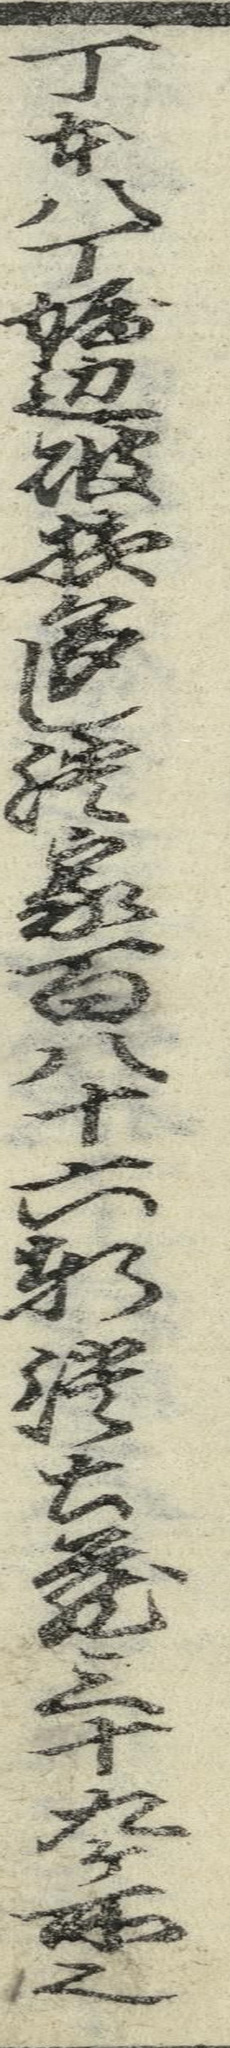丁本八丁堀辺破損多し潰家百八十六軒潰土蔵三十九ケ所也
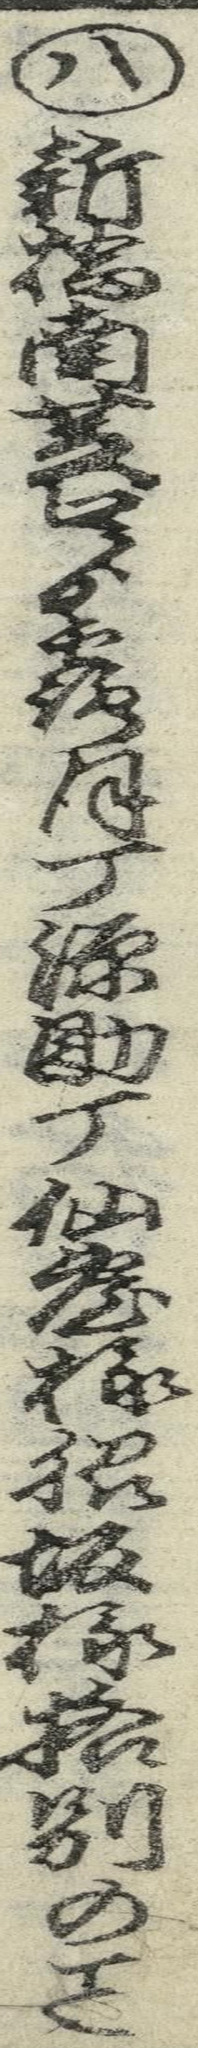㊇新宿南芝口ゟ露月丁源助丁仙台様脇坂様格別のこと
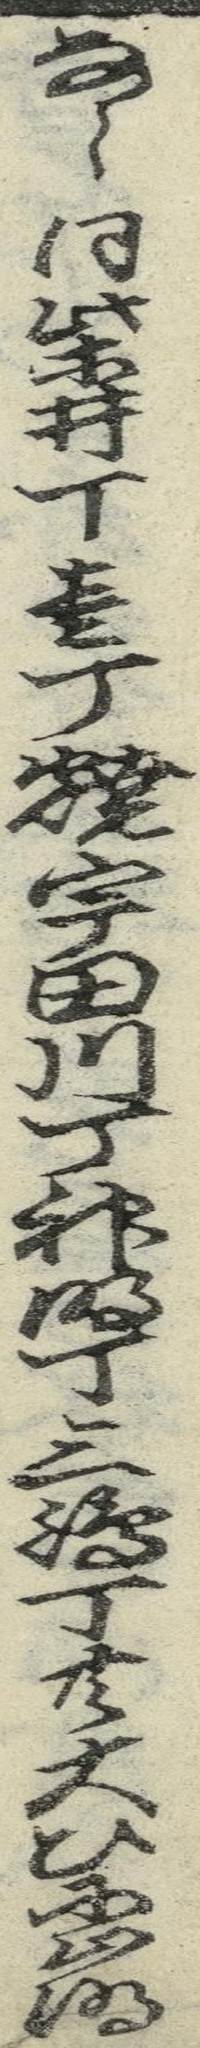なし同柴井丁壱丁焼宇田川丁神明丁三嶋丁共大ひに崩
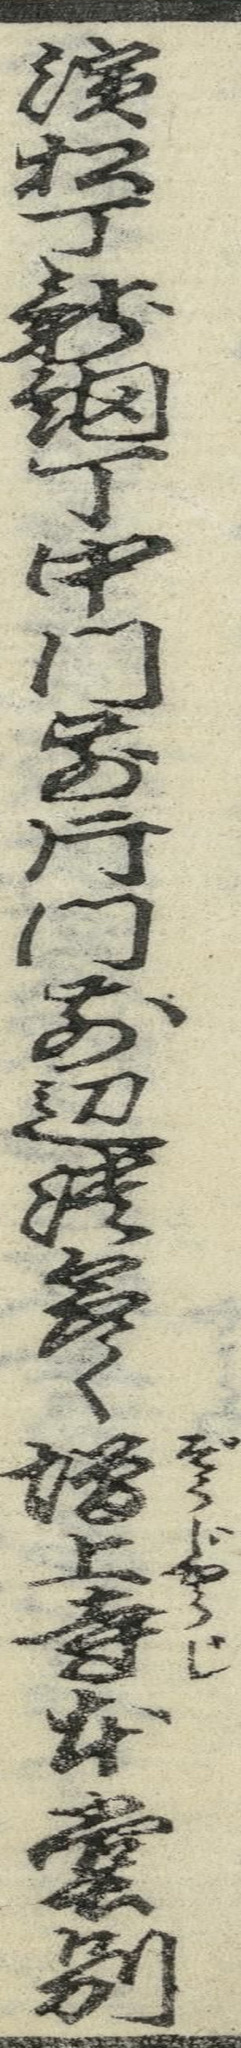浜松丁新綱丁中門前片門前辺潰多く増上寺本堂別

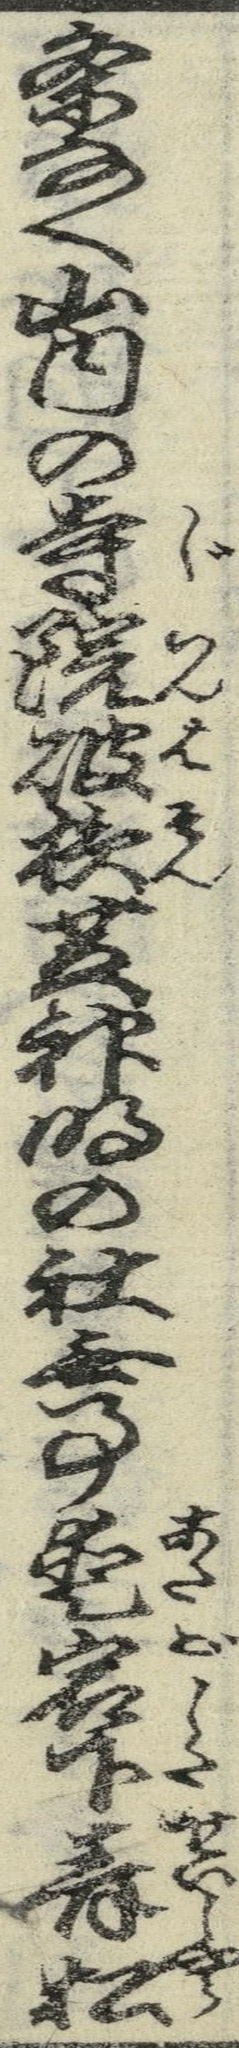条なく山内の寺院破損芝神明の社無事愛宕下青松
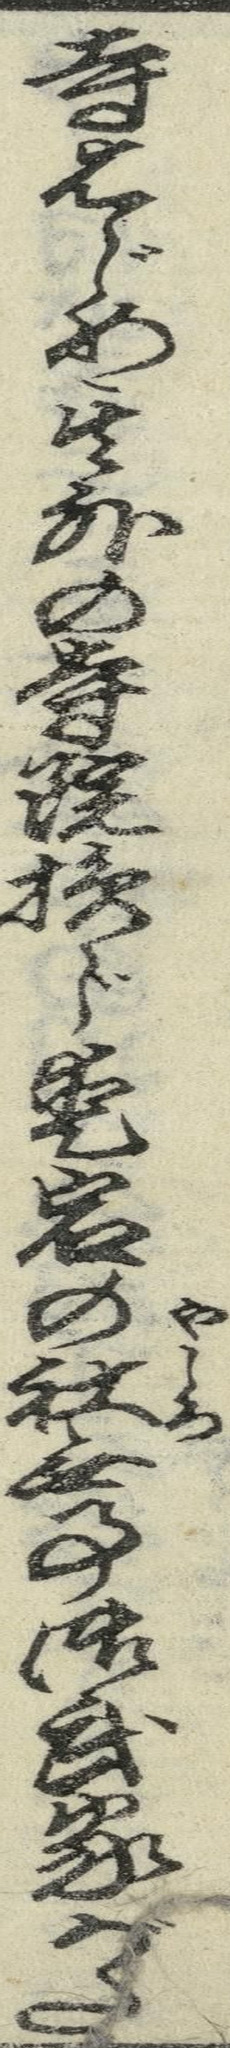寺はじめ其外の寺院損じ愛宕の社無事御武家がた
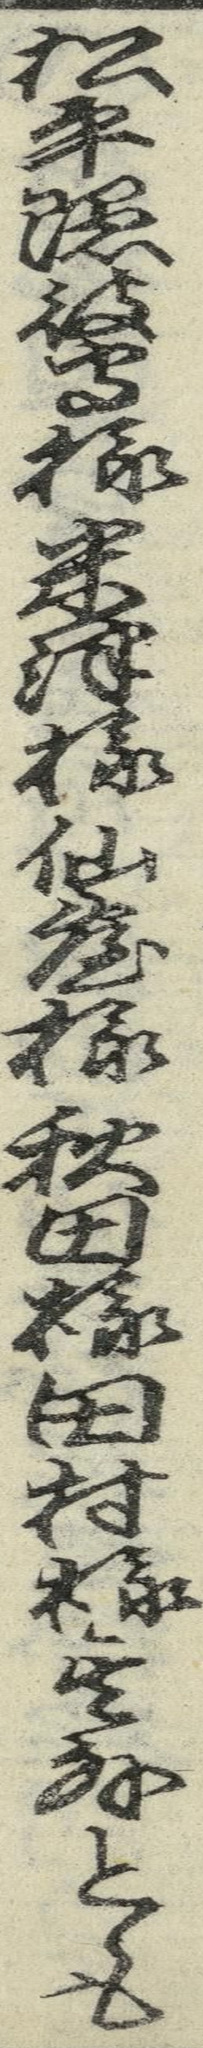松平隠岐守様米津様仙台様秋田様田村様其外とも
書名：地震年代記
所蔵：東京大学地震研究所図書室 Earthquake Research Institute Library, The University of Tokyo, JAPAN
